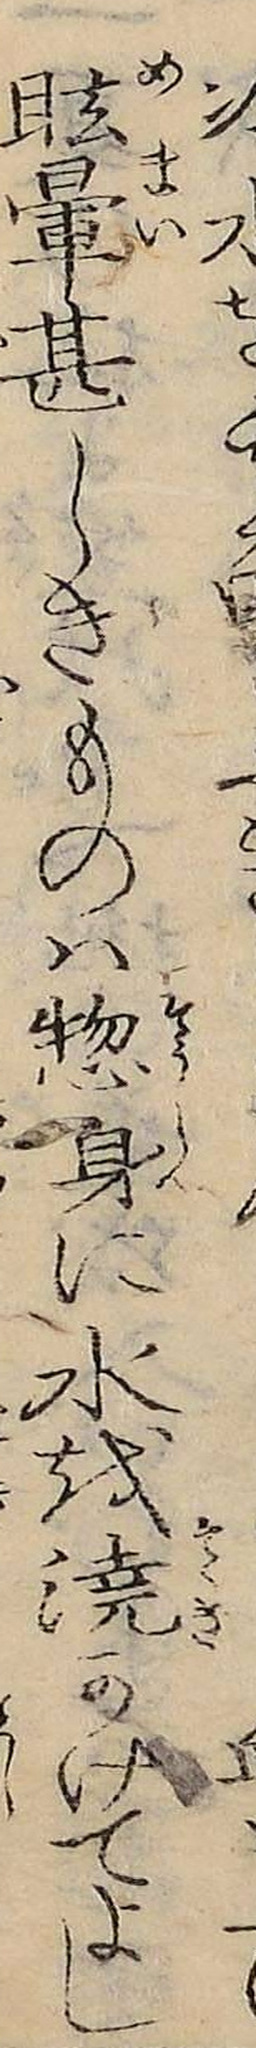眩暈甚しきものは惣身に水を澆かけてよし
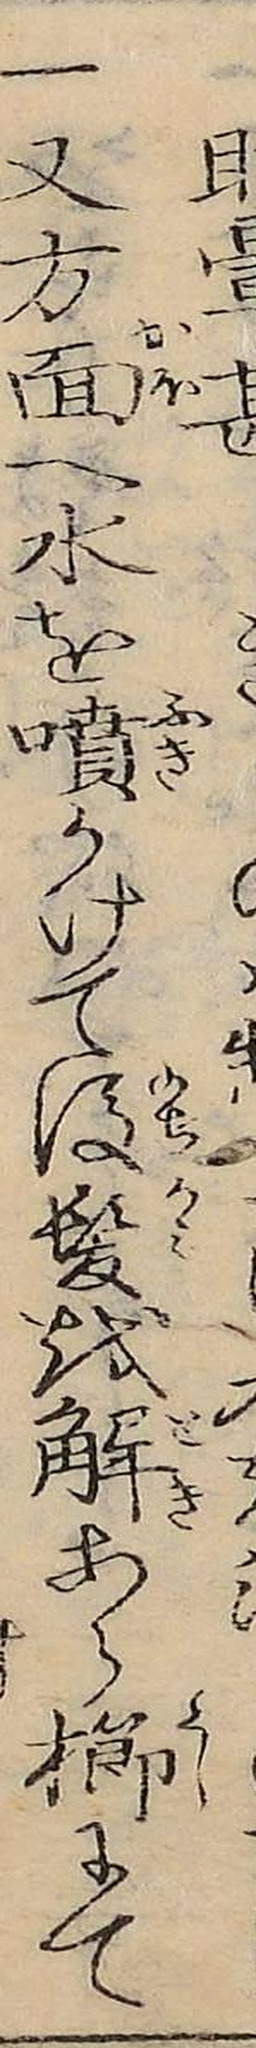一又方面へ水を噴かけて後髪を解あら櫛にて
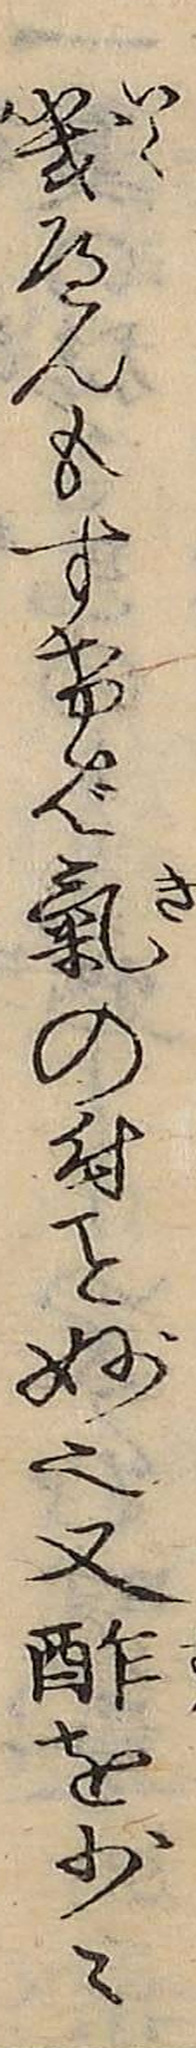幾へんもすけば気の付こと妙也又酢を少々
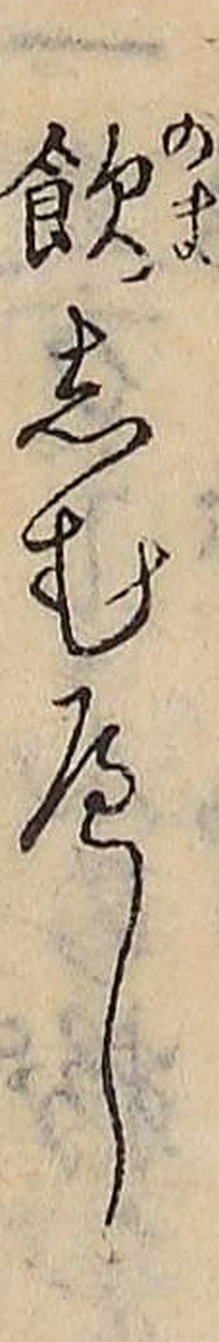飲しむへし
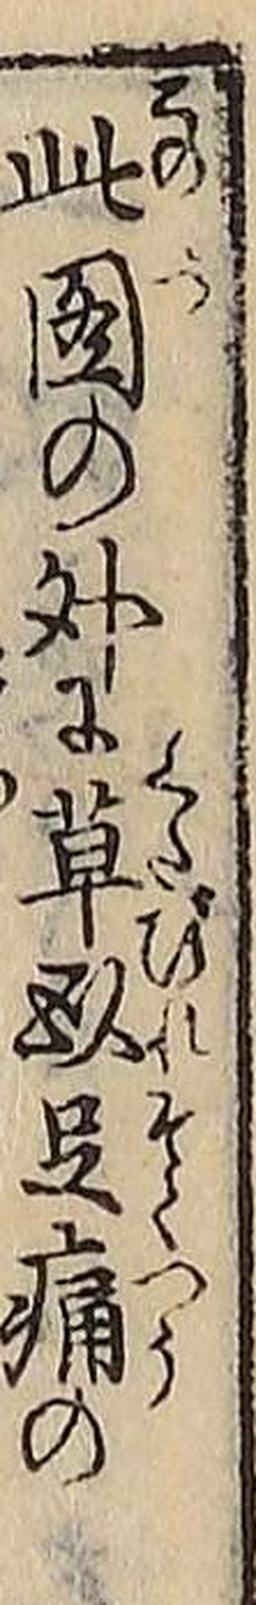此図の外に草臥足痛の
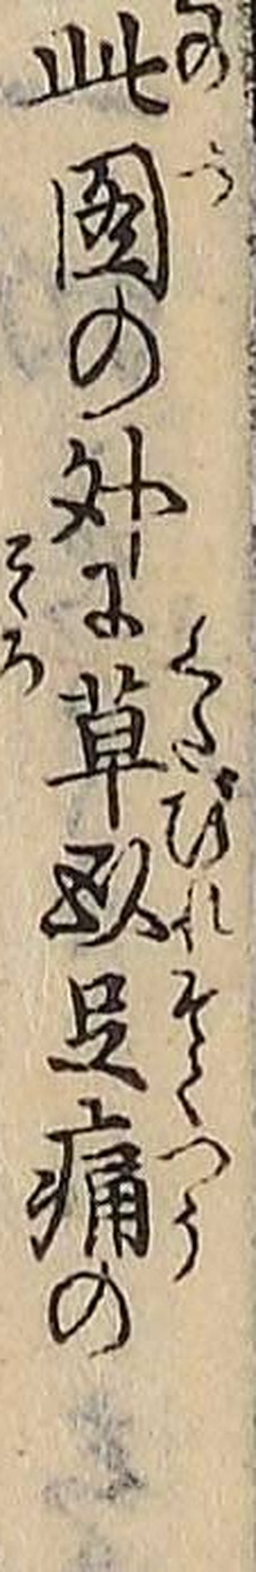此図の外に草臥足痛の
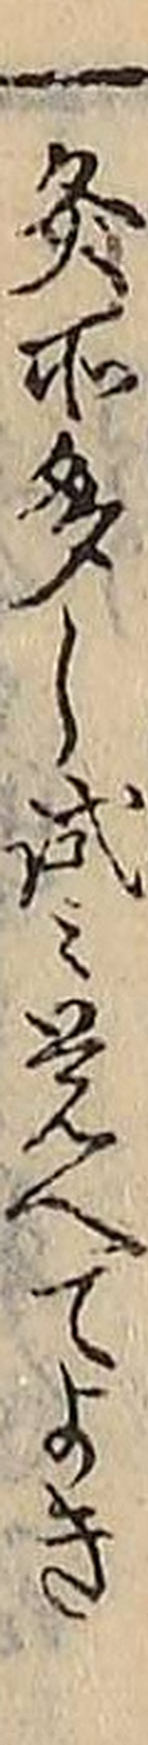灸所多し試み覚へてよき
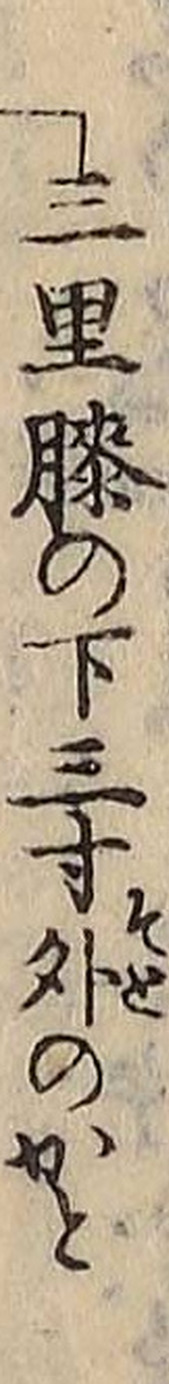三里膝の下三寸外のかと
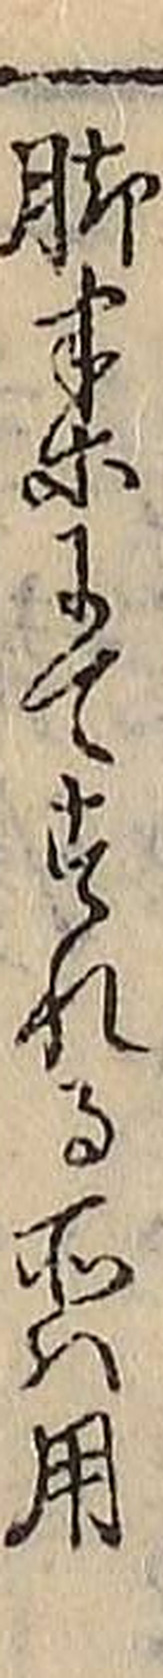脚半等にてすれる所は用
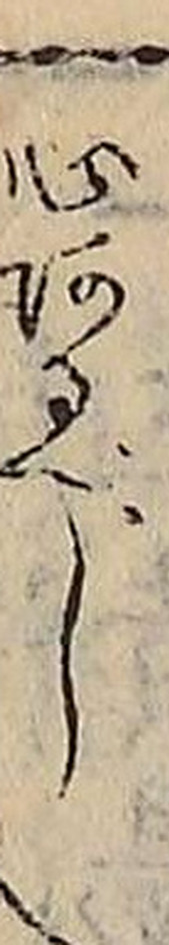心あるべし
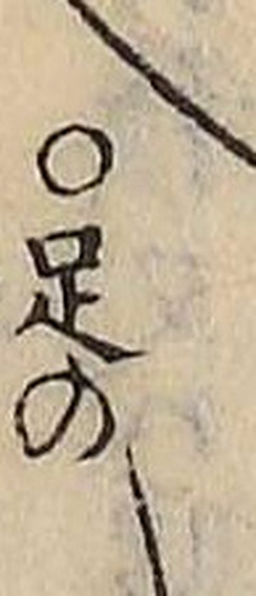○足の
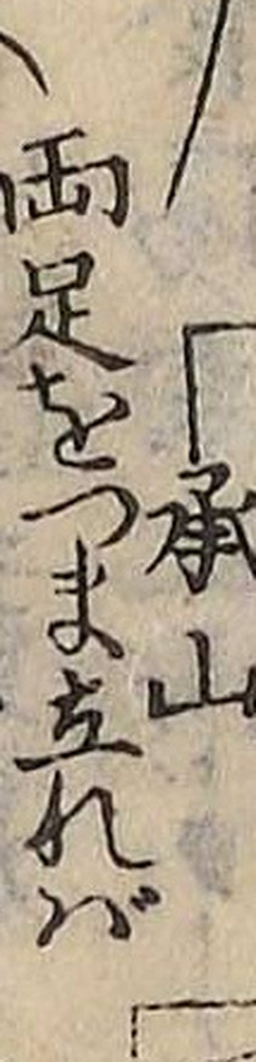両足をつま立れば
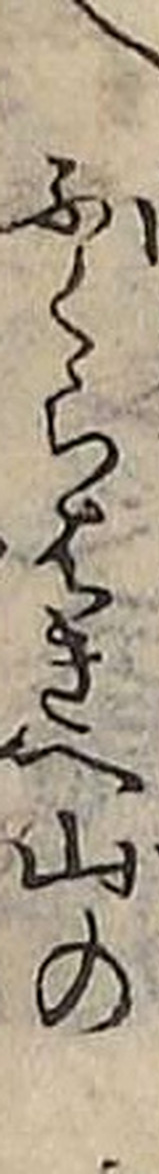ふくらはきへ山の
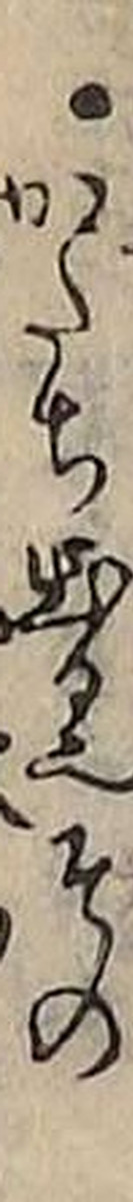かたち出る也その
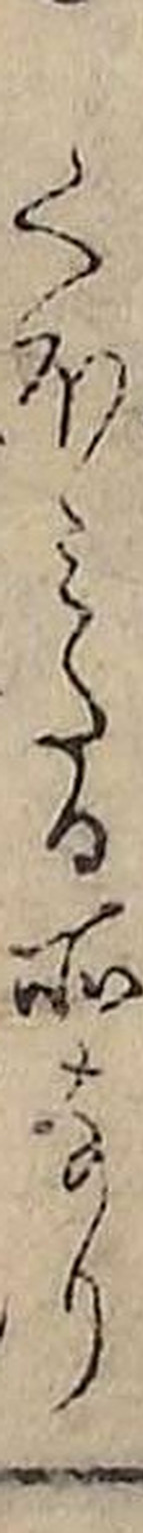くほみたる所なり
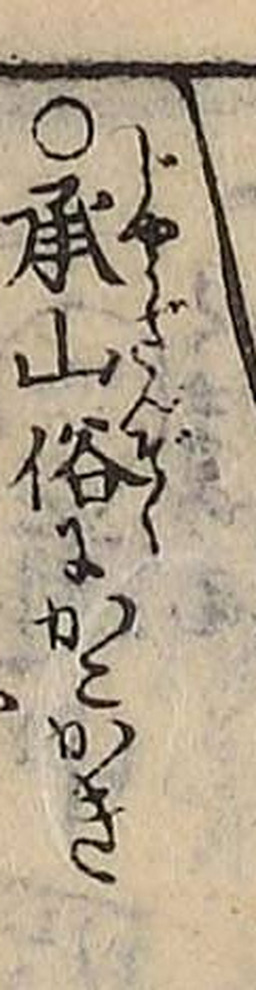○承山俗にかこかき
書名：旅行用心集
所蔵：神戸大学附属図書館 国文学研究資料館
